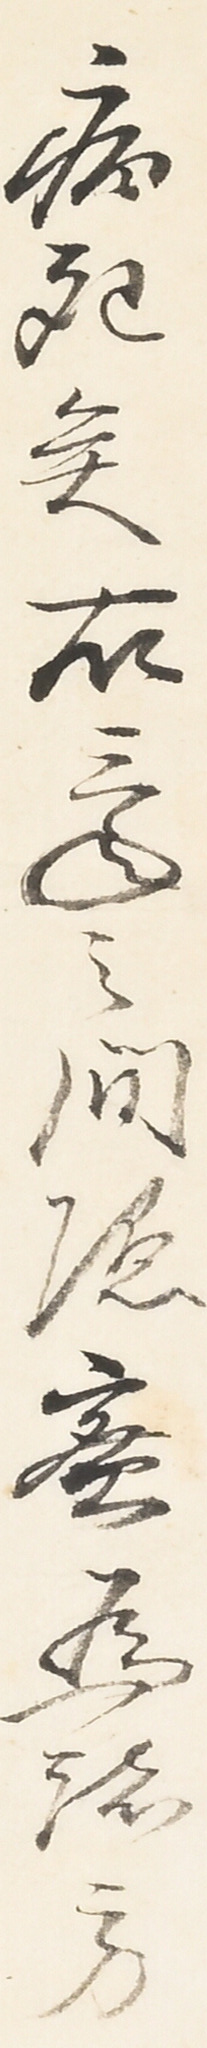病死矣右三年之間隠密為諸方
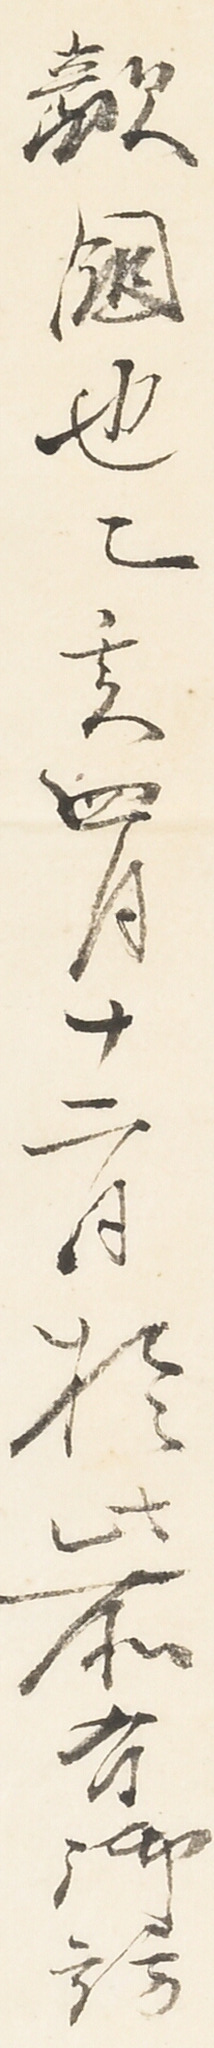敵国也乙亥四月十二日於此所有御訪
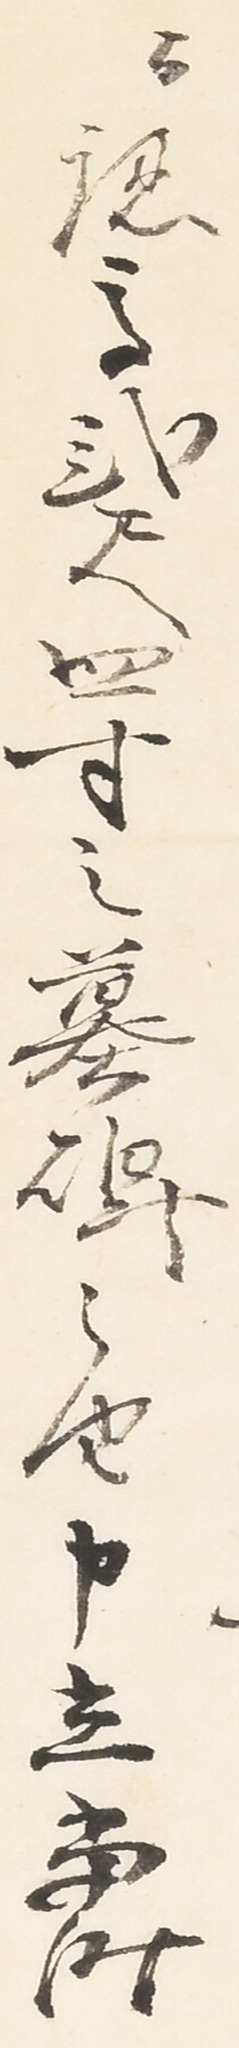而認高弐尺四寸之墓碑之由申立当時
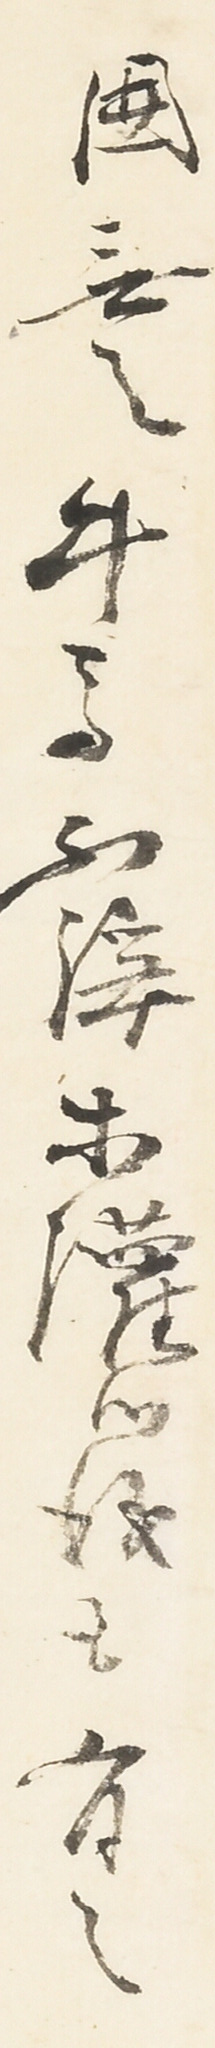囲無之牛馬不浄等灌候儀も有之
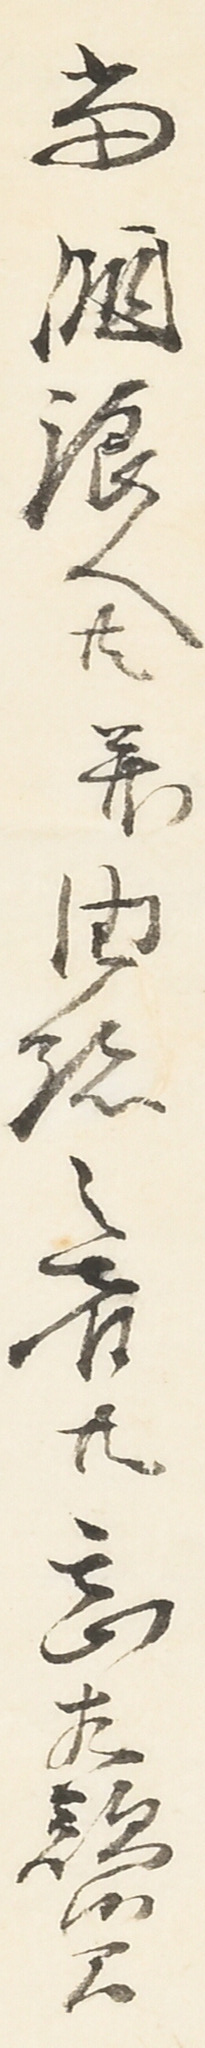当国浪人共幷由緒之者共甚相歎候間
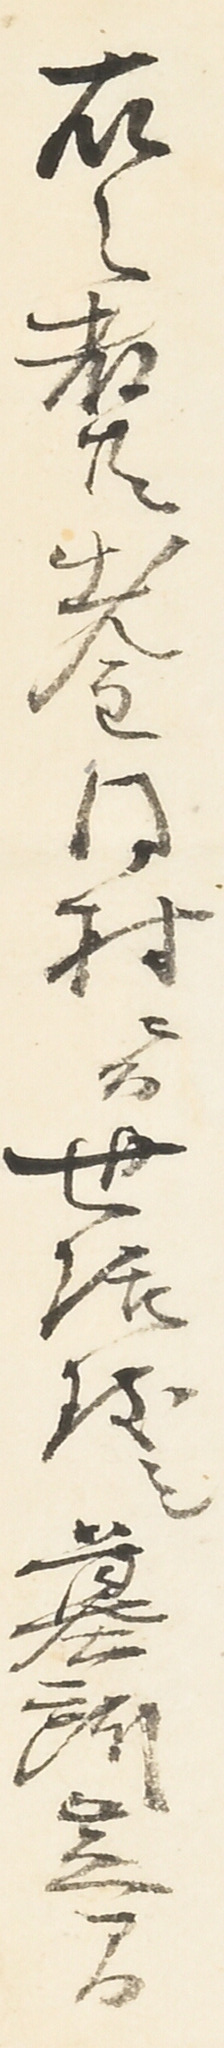右之者共出金同村ニ而世話致シ墓所定間
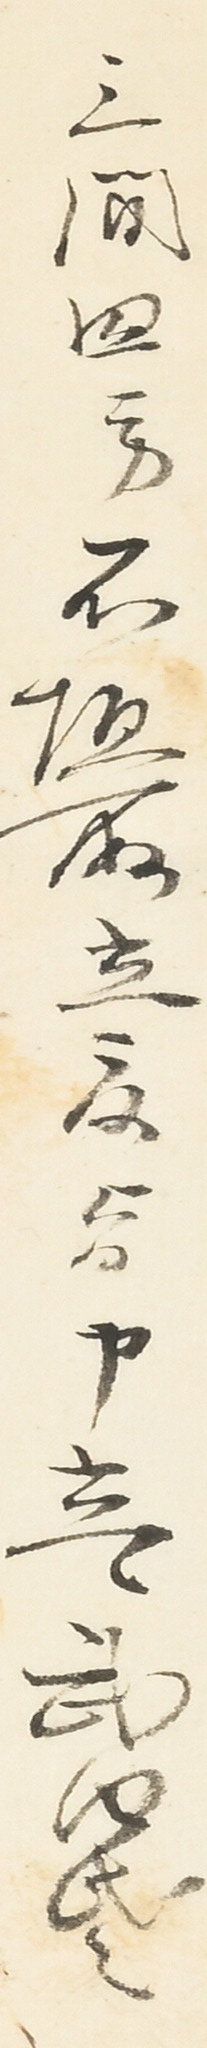三間四方石垣取立度旨申立候武田氏之
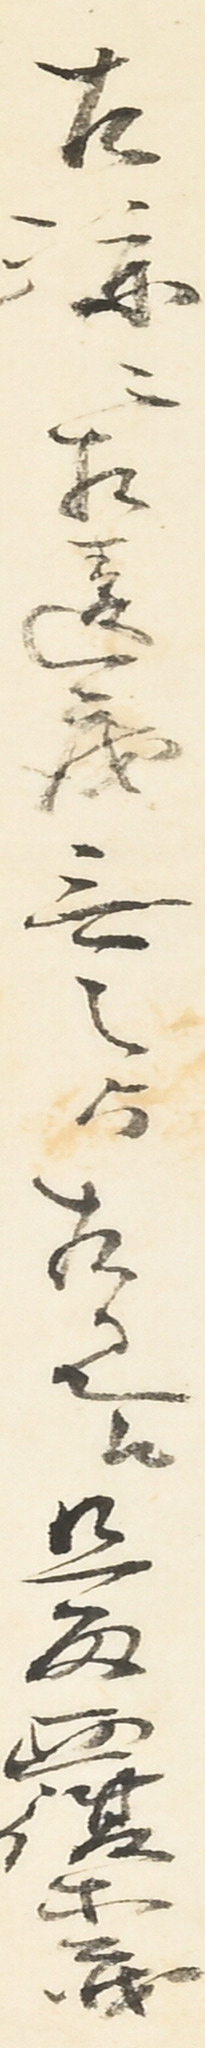古跡ニ相違も無之と相見え且雨覆等も

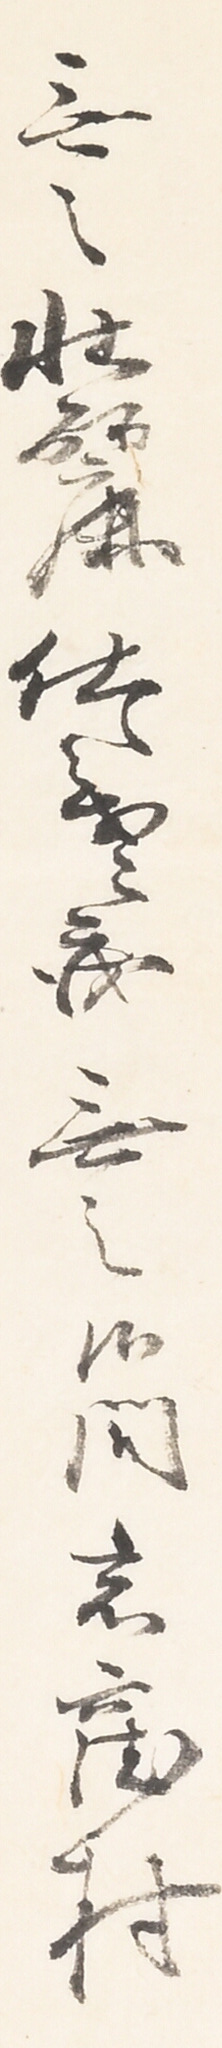無之壮麗仕候義ニも無之候間岩窪村
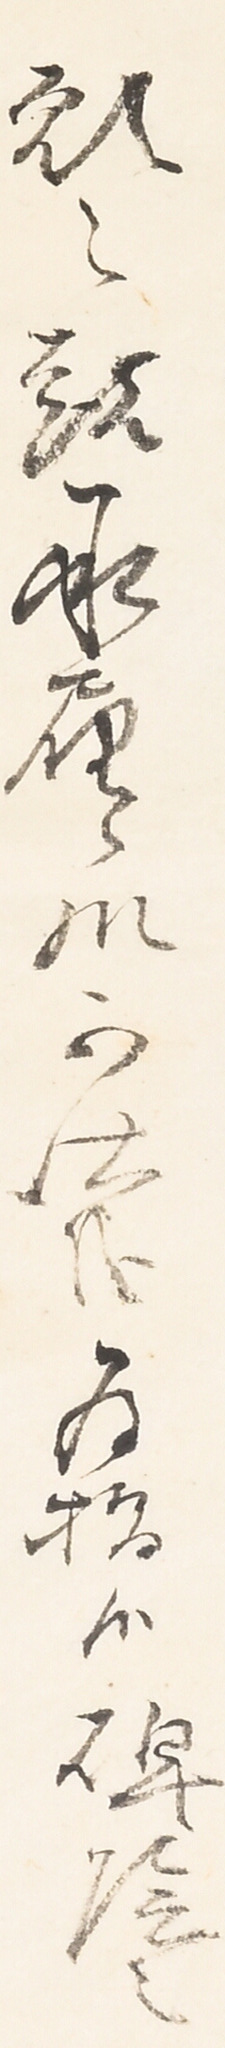願之趣承届候様可仕哉為摺候碑陰之
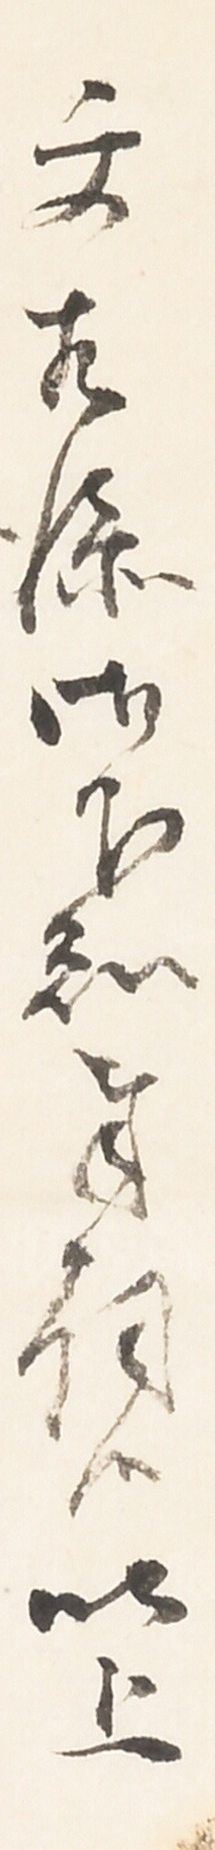文相添御下知奉伺候以上

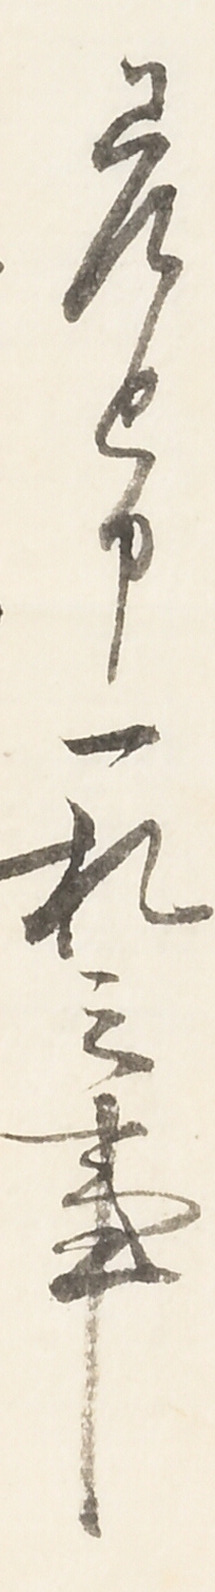差上申一札之事
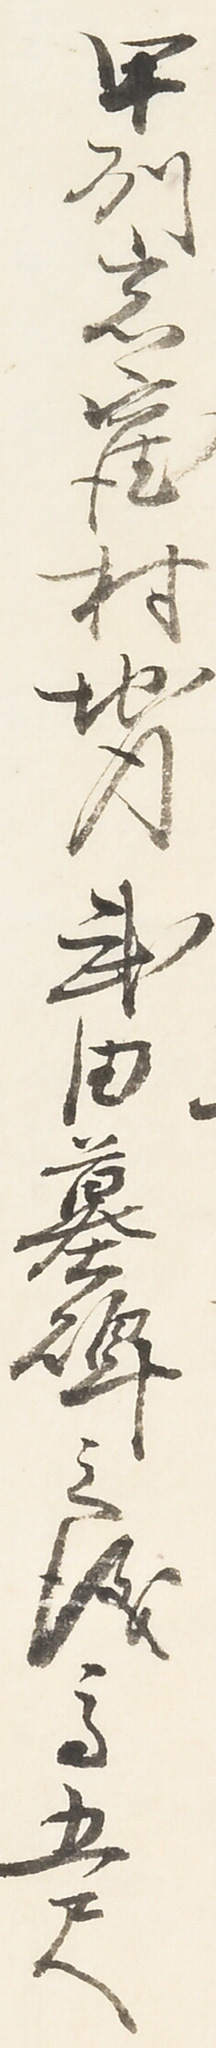甲州岩窪村地内武田墓碑之儀高五尺
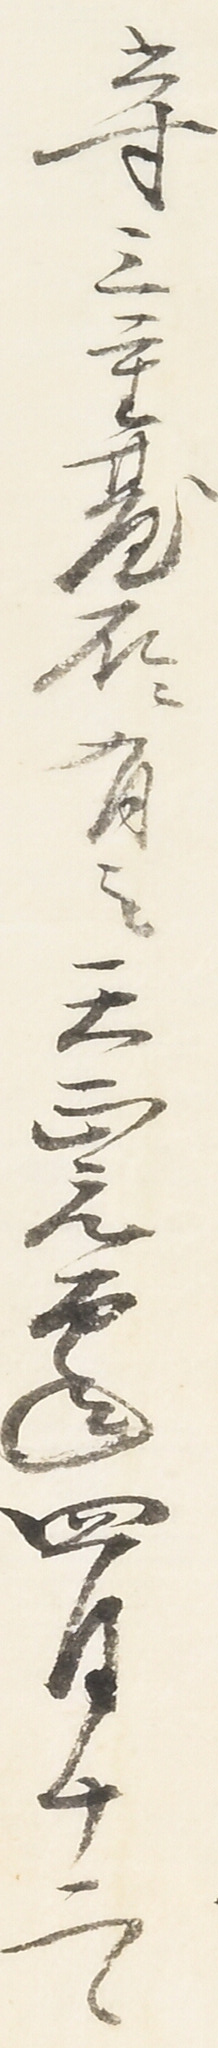六寸三重台石ニ有之天正元酉年四月十二日
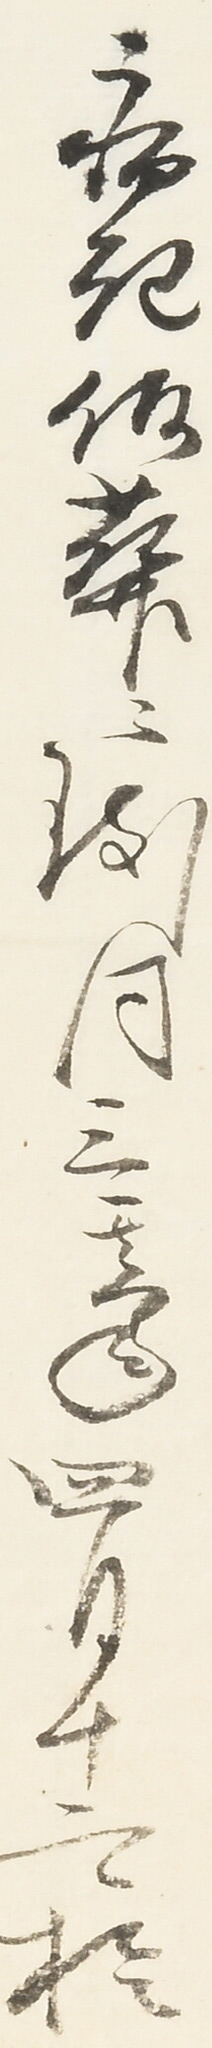病死仮葬ニ致し同三亥年四月十二日於
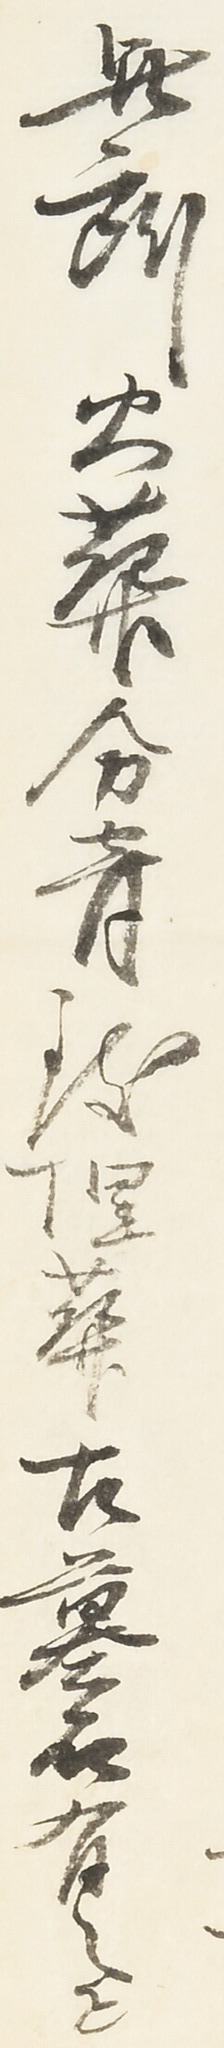此所火葬分骨致埋葬古墓石有之を
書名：岩窪廟取（所）墓碑囲石垣取建伺書
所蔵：伊那市立高遠町図書館・合同会社AMANE
